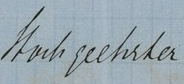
Hochgeehrter
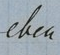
Herr
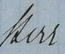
macht
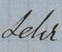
eine sehr
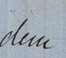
Mittheilung.
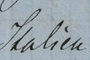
Anzeige
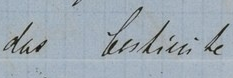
das bestimmte
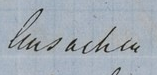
dass der
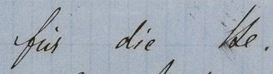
für die Be-
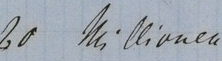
20 Millionen
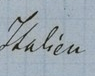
Gestern
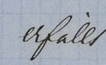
erhielt
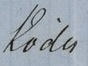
einen
